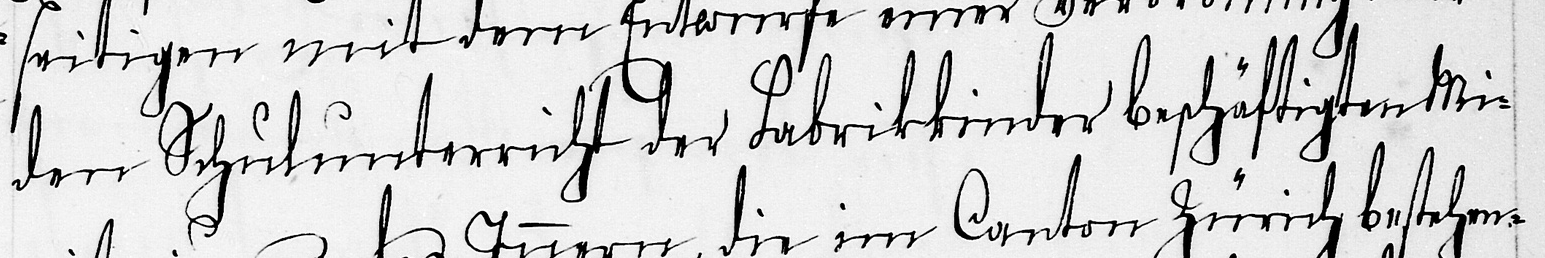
den Schulunterricht der Fabrikkinder beschäftigten Mi¬
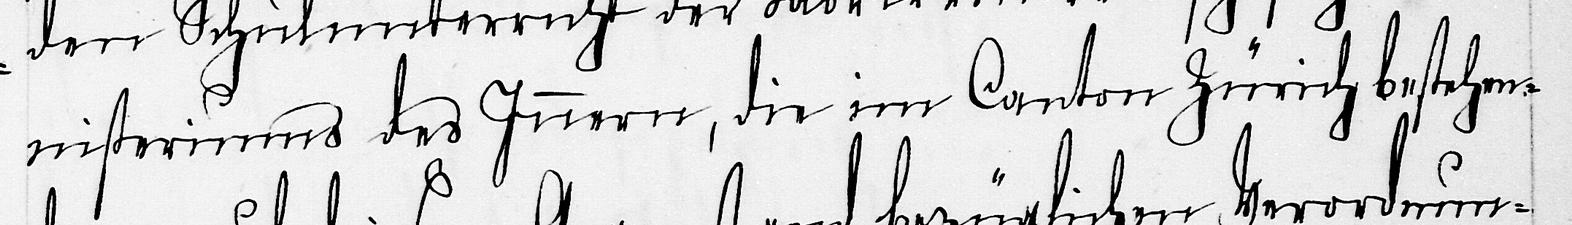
nisteriums des Innern, die im Canton Zürich bestehen¬
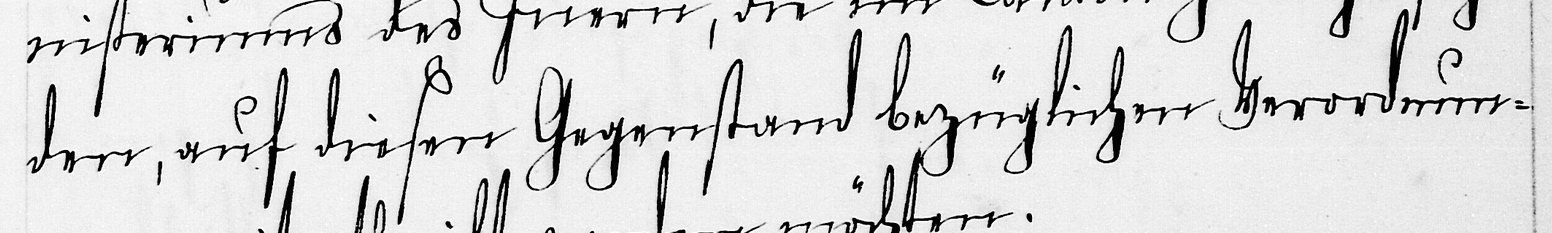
den, auf diesen Gegenstand bezüglichen Verordnun¬
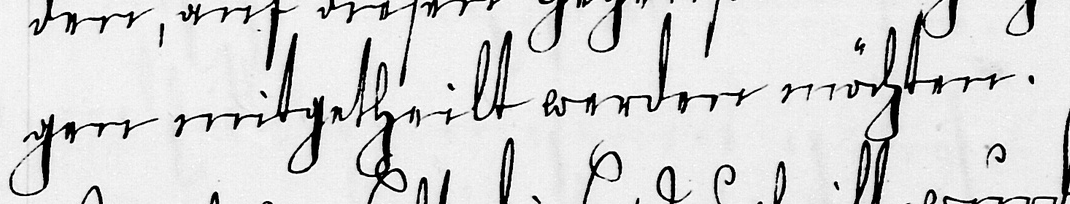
gen mitgetheilt werden möchten.
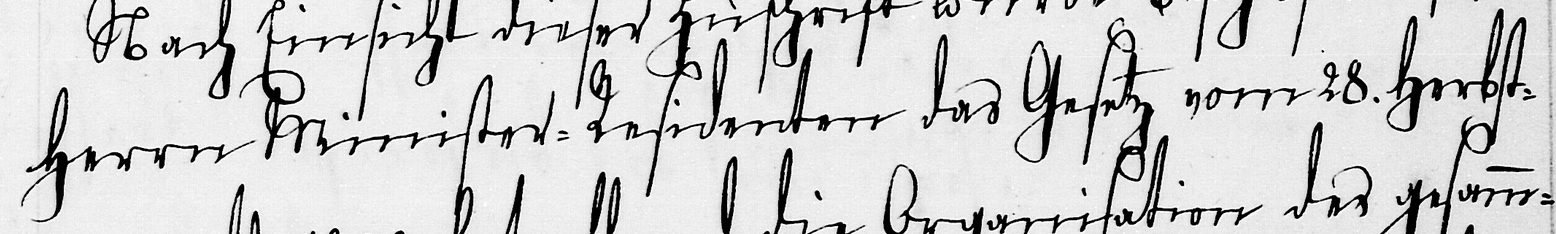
Herrn Minister-Residenten das Gesetz vom 28. Herbst¬
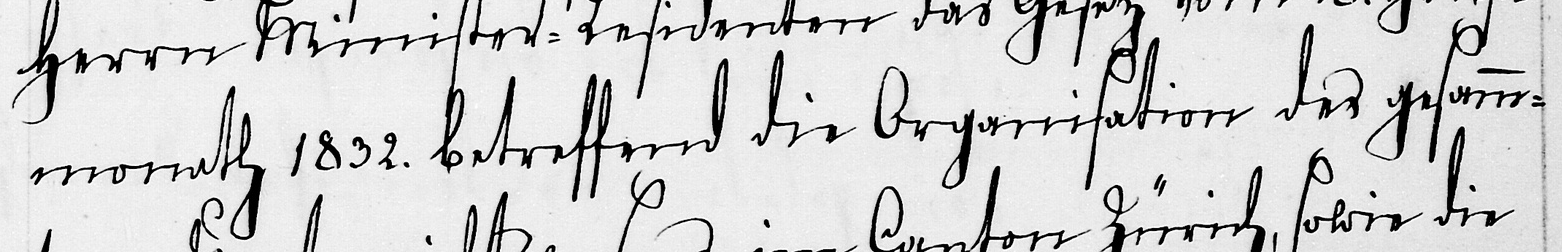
monath 1832. betreffend die Organisation des gesamm¬
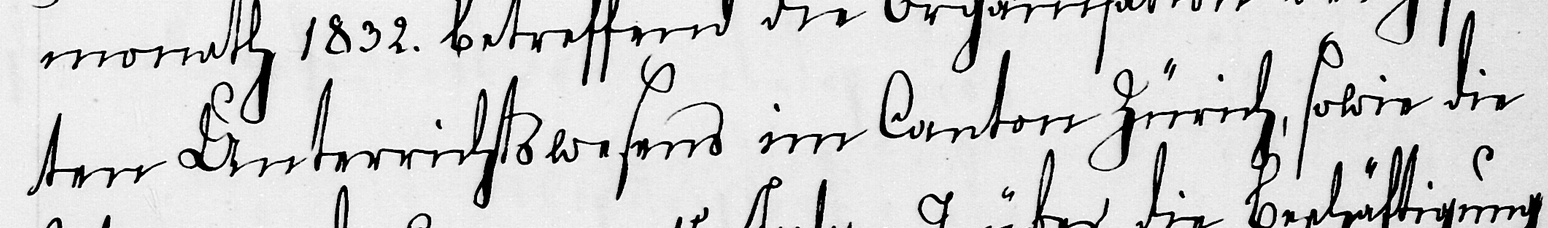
ten Unterrichtswesens im Canton Zürich, sowie die
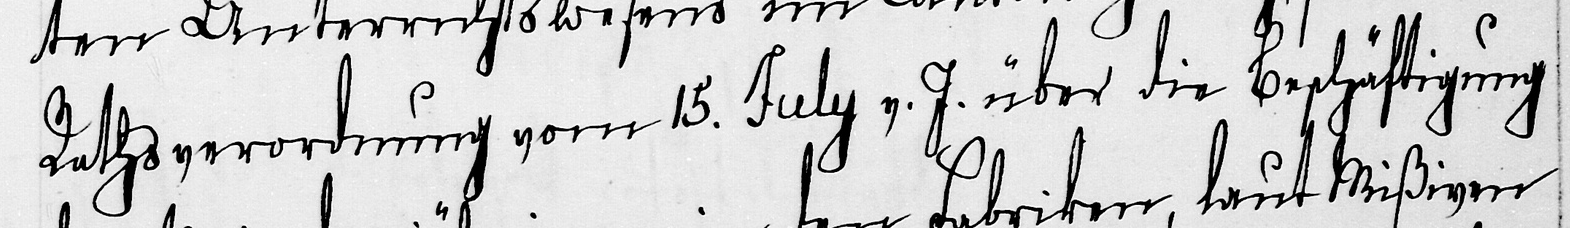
Rathsverordnung vom 15. July v. J. über die Beschäftigung
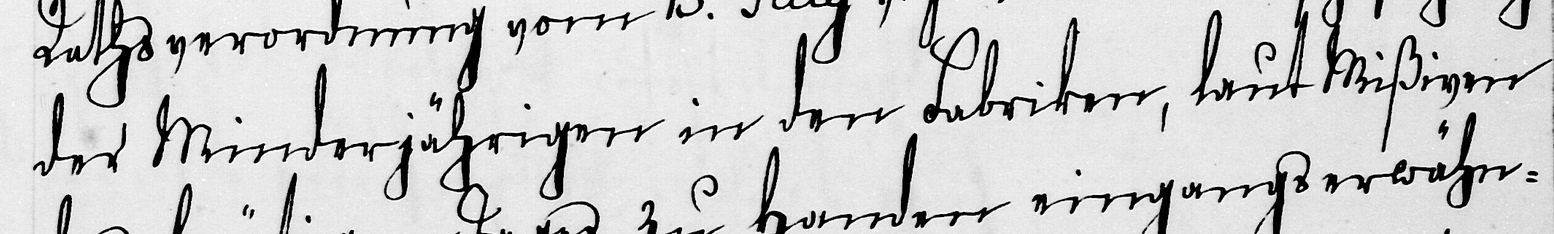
der Minderjährigen in den Fabriken, laut Mißiven
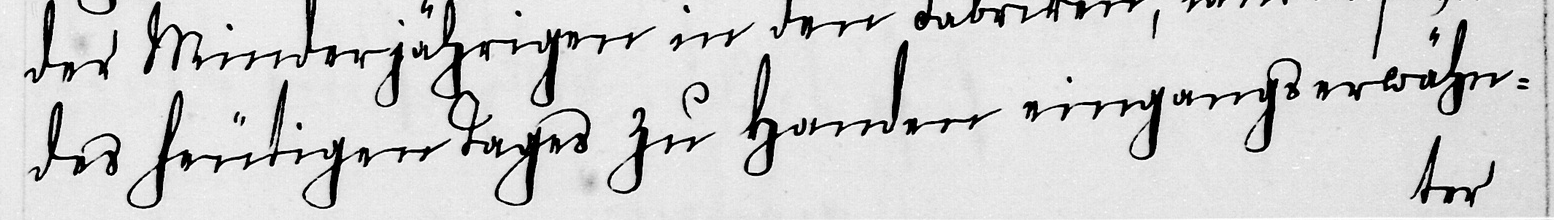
des heutigen Tages zu Handen eingangserwähn-
